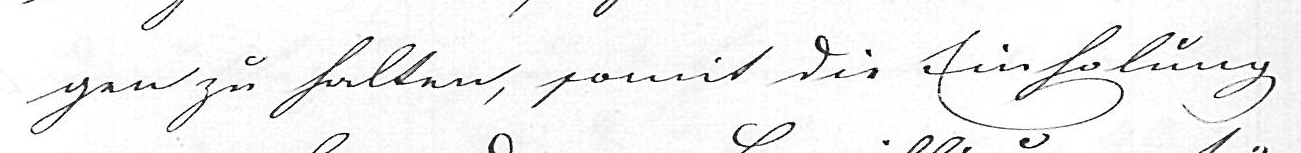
gen zu halten, somit die Einholung
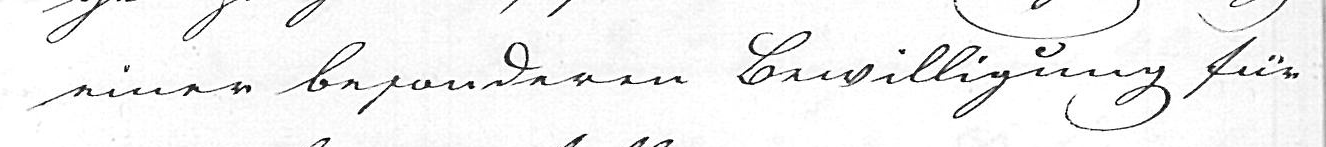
einer besonderen Bewilligung für
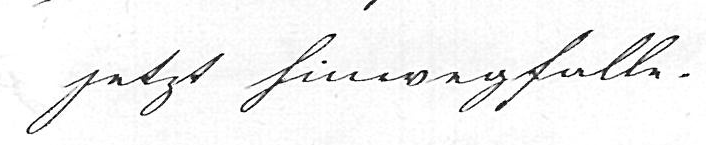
jetzt hinwegfalle.
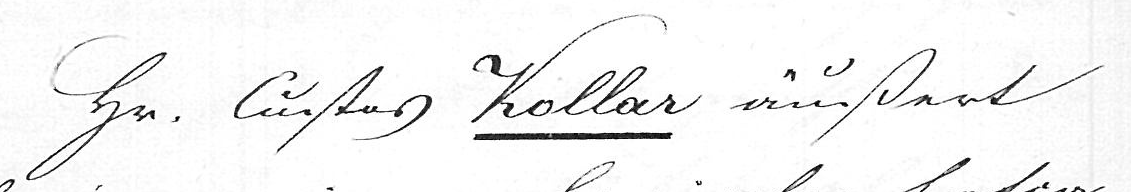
Hr. Custos Kollar äußert
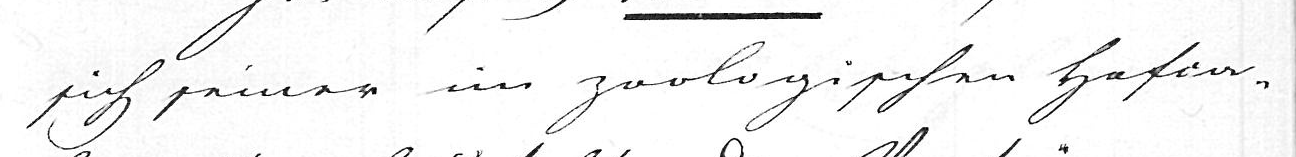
sich seiner im zoologischen Hofca-
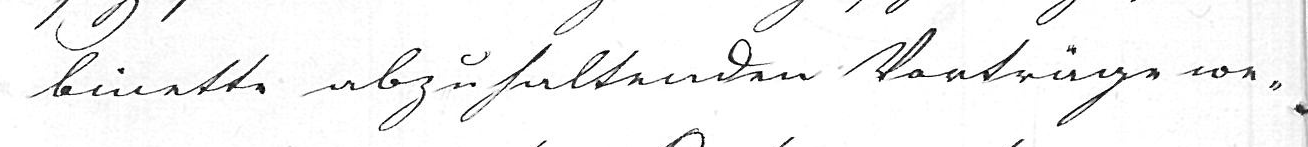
binette abzuhaltenden Vorträge we-
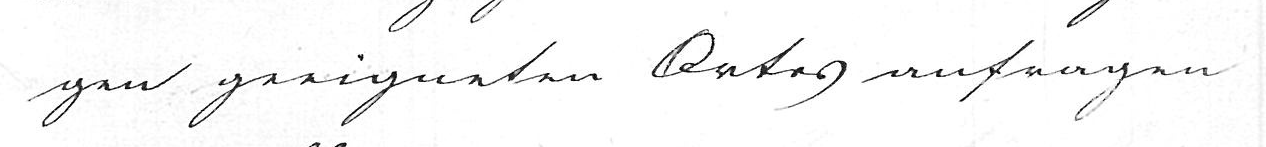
gen geeigneten Ortes anfragen
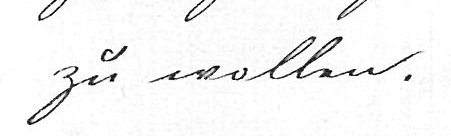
zu wollen.
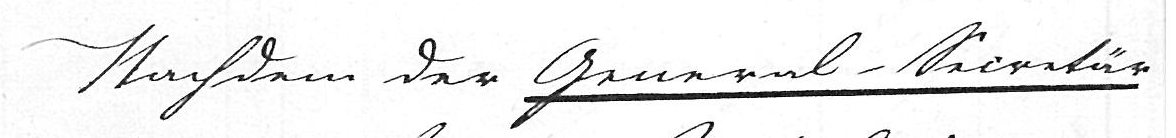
Nachdem der General-Secretär
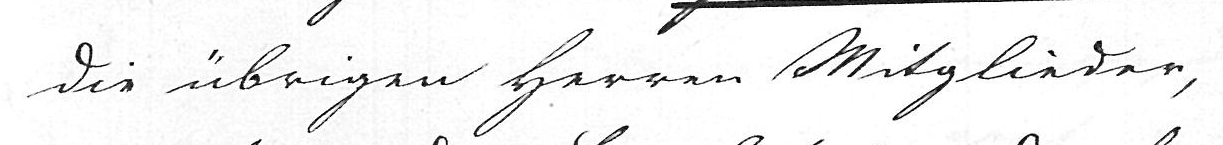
die übrigen Herren Mitglieder,
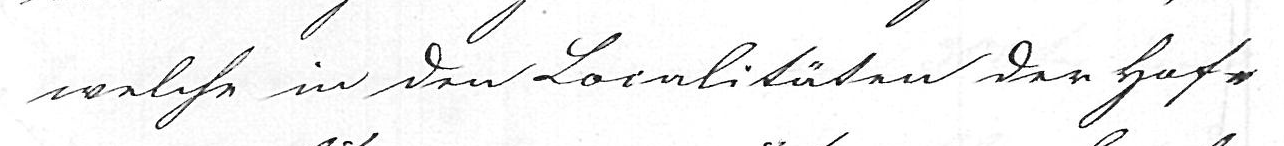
welche in den Localitäten der Hof-
